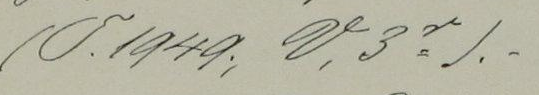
(T.1949; V.3r). -
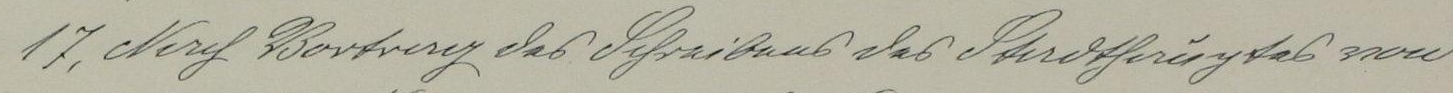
17. Nach Vortrag des Schreibens des Stadthauptes von
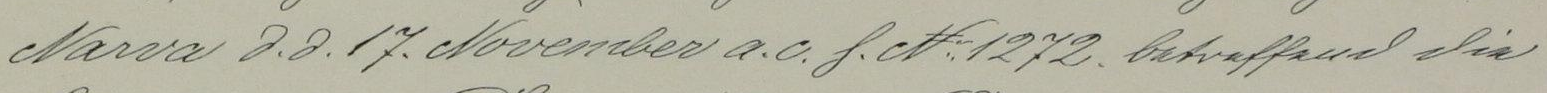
Narva d.d. 17. November a.c. s. No. 1272. betreffend die
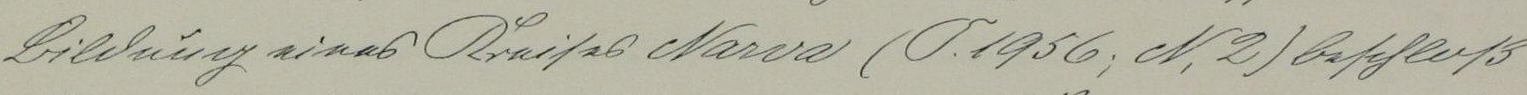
Bildung eines Kreises Narva (T.1956; N.2), beschloß
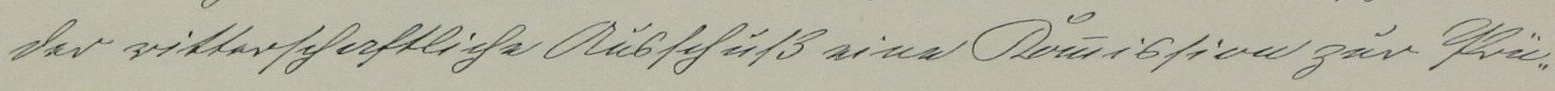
der ritterschaftliche Ausschuß eine Kommission zur Prü-
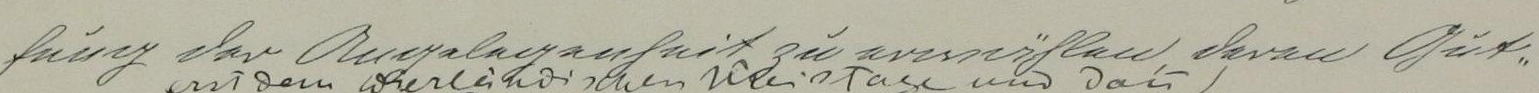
fung der Angelegenheit zu erwählen, deren Gut-
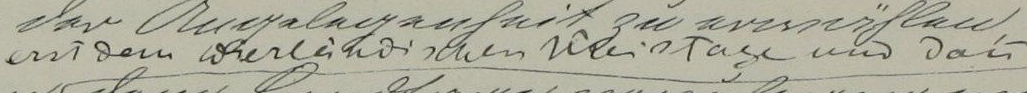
erst dem Wierländischen Kreistage und dann
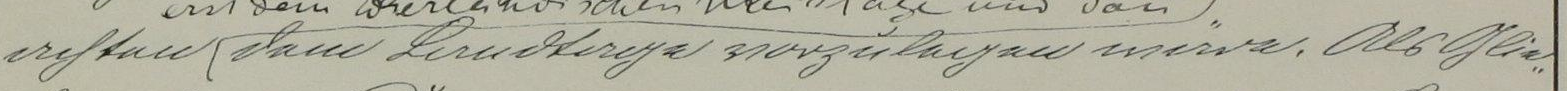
achten dem Landtage vorzulegen wäre. Als Glie-
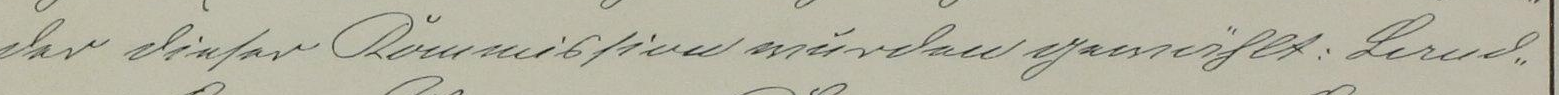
der dieser Kommission wurden gewählt: Land-
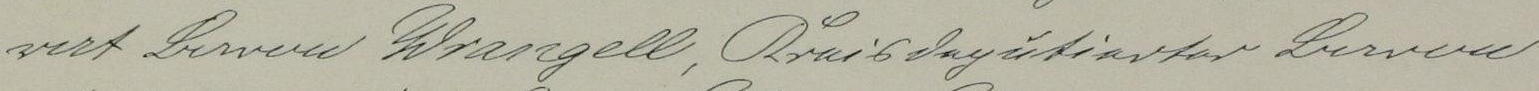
rat Baron Wrangell, Kreisdeputierter Baron
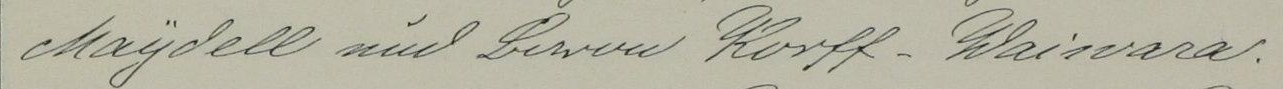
Maydell und Baron Korff-Waiwara.
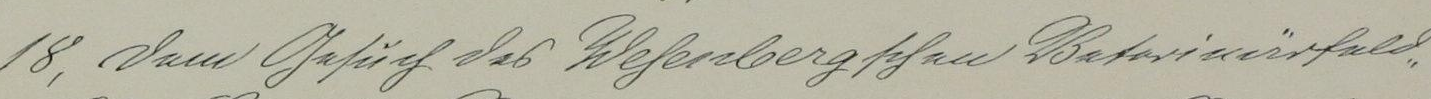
18. Dem Gesuch des Wesenbergschen Veterinärfeld-
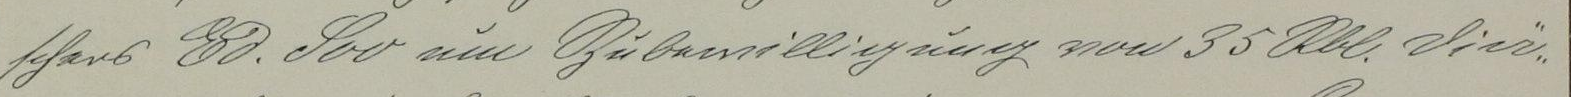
schers Ed. Soo um Zubewilligung von 35 Rbl. Diä-
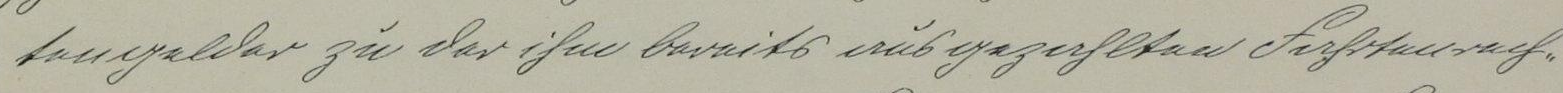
tengelder zu der ihm bereits ausgezahlten Fahrtenrech-
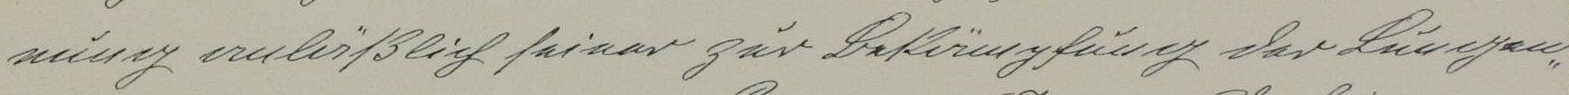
nung anläßlich seiner zur Bekämpfung der Lungen-
